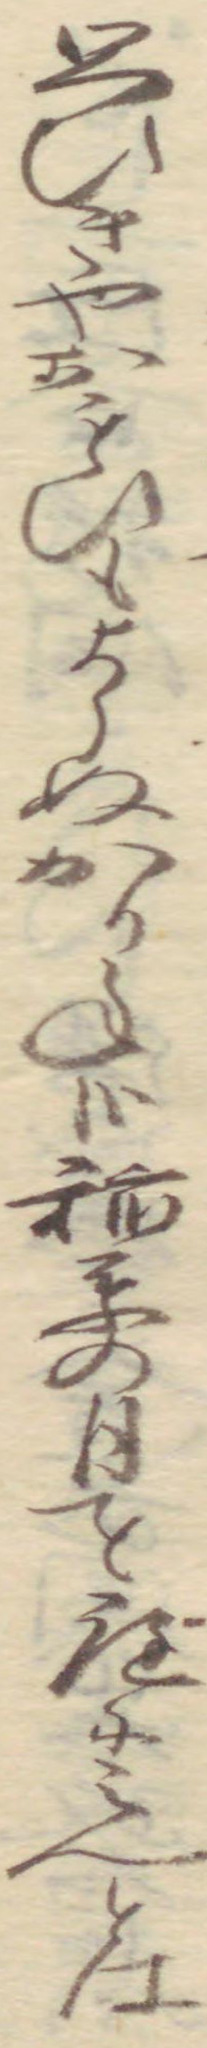思ひきやおもひもよらぬかりね哉稲葉の月を庭にみんとは
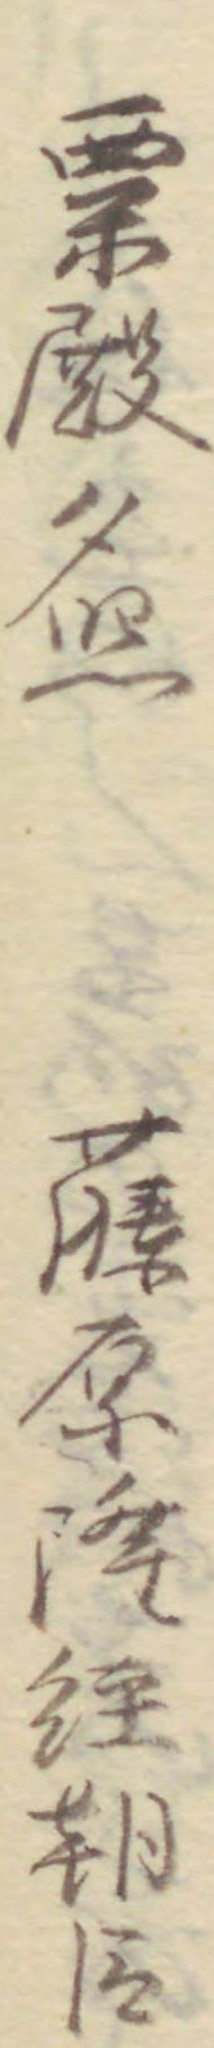粟殿夕照藤原隆経朝臣
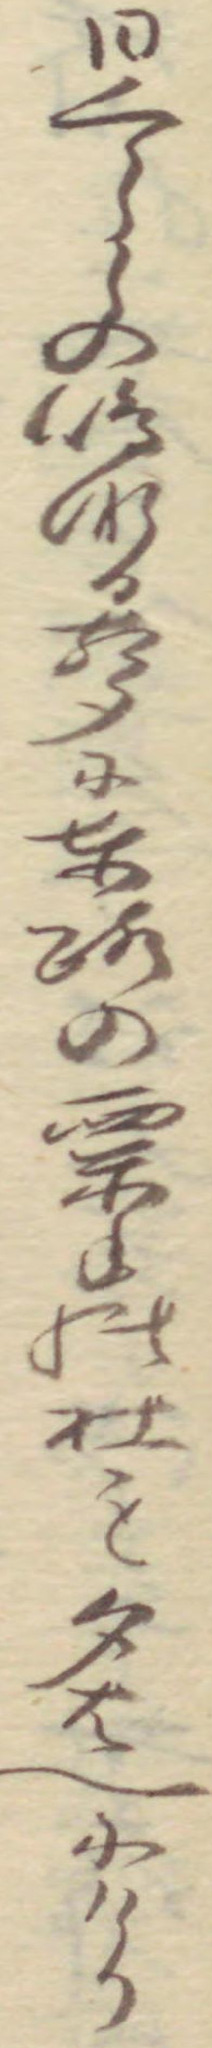日くらしの鳴なる声に東路の粟手の杜も夕はへにけり
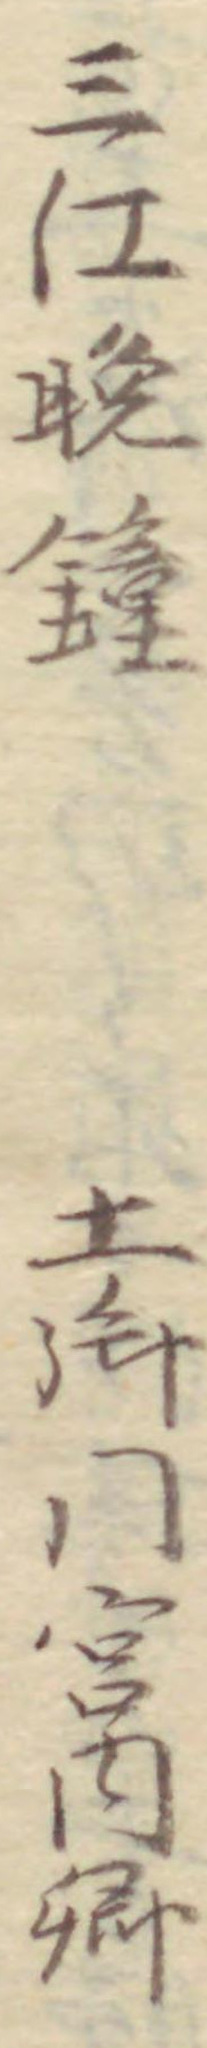三江晩鐘土御門宮内卿
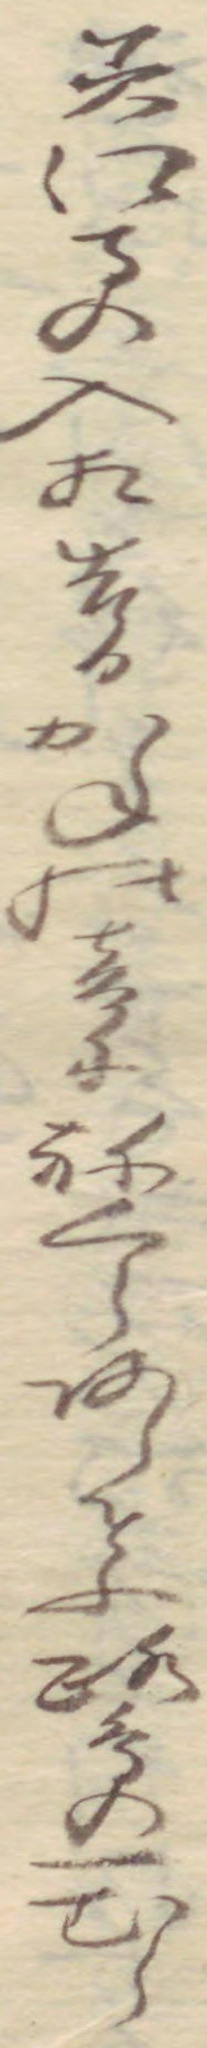美江寺の入相告るかねの音にねくらあらそう鷺の一むら
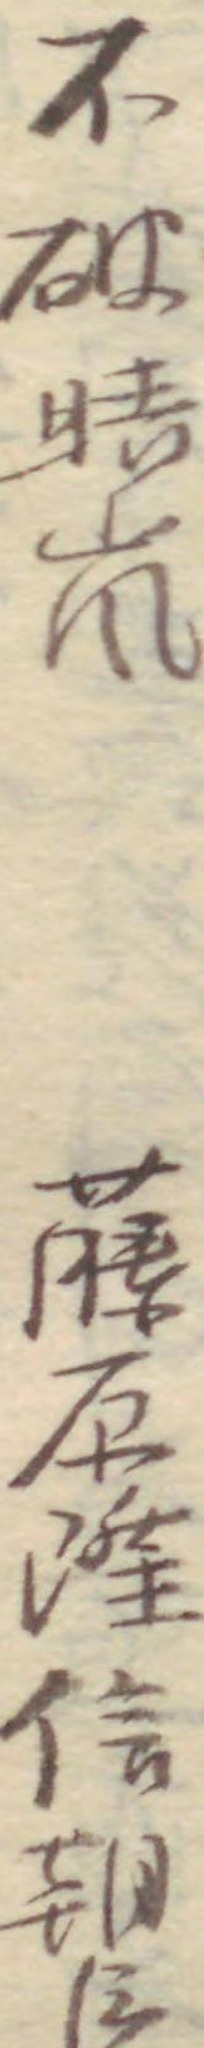不破晴嵐藤原隆信朝臣
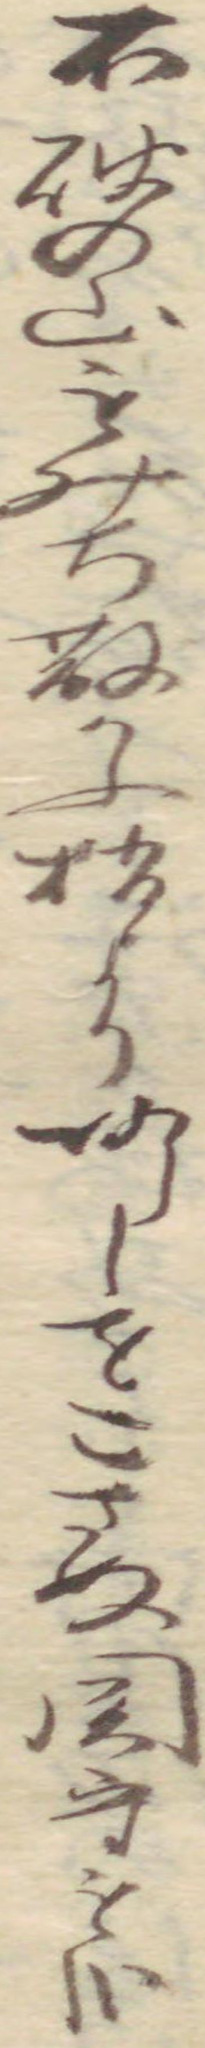不破の山もみち散かふ梢よりあらしをこさぬ関守も哉
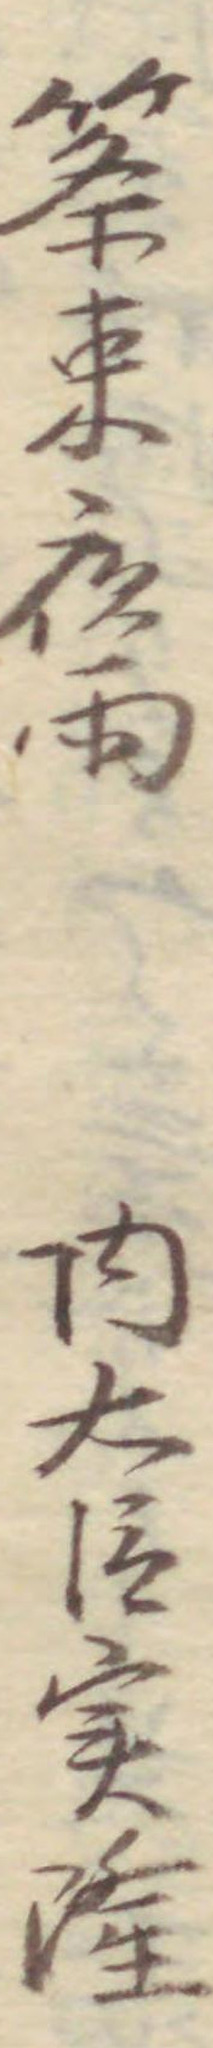篠束夜雨内大臣実隆
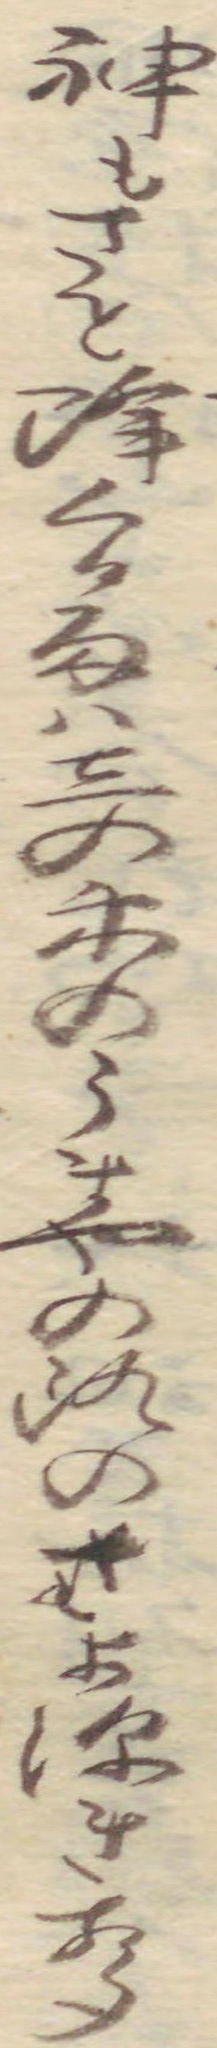神もさそ降くる雨はしの束のうやまの鈴のさよ深き声
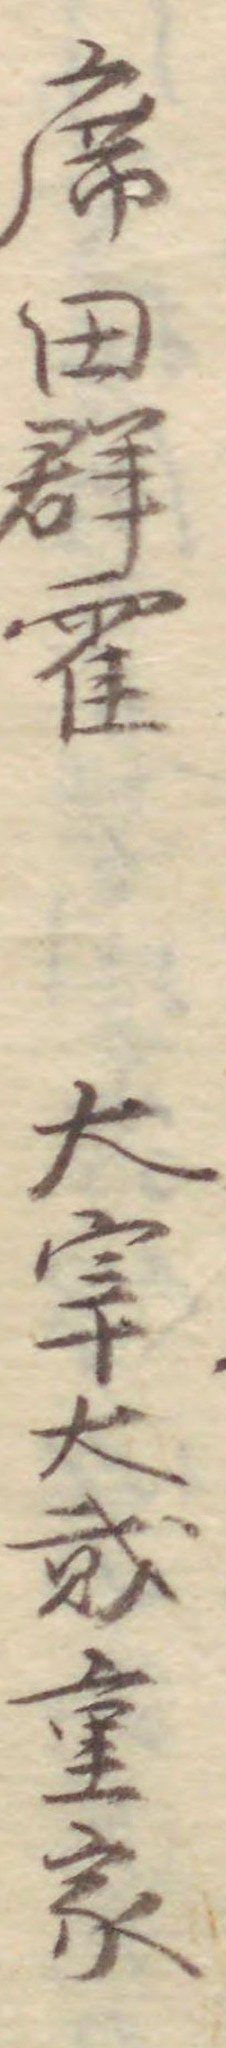席田群霍大宰大弐重家
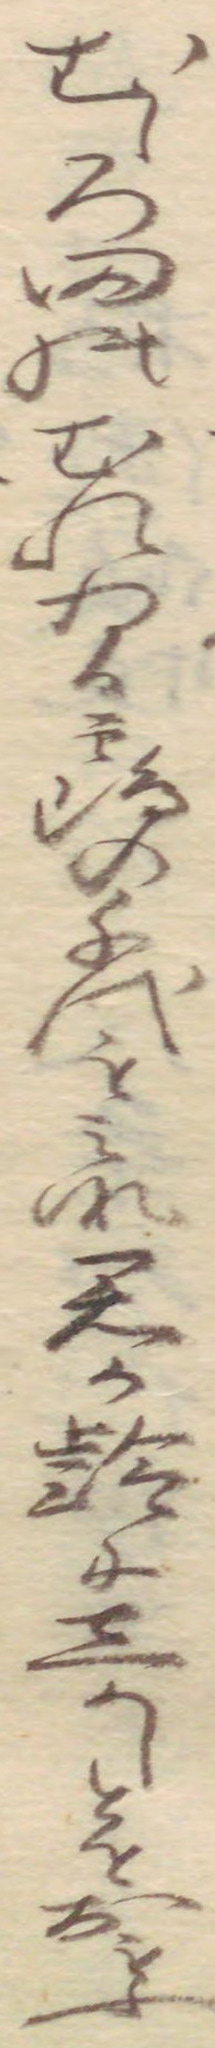むしろ田のむれゐる靏の千代もみな君か齢にしかしとそおもふ
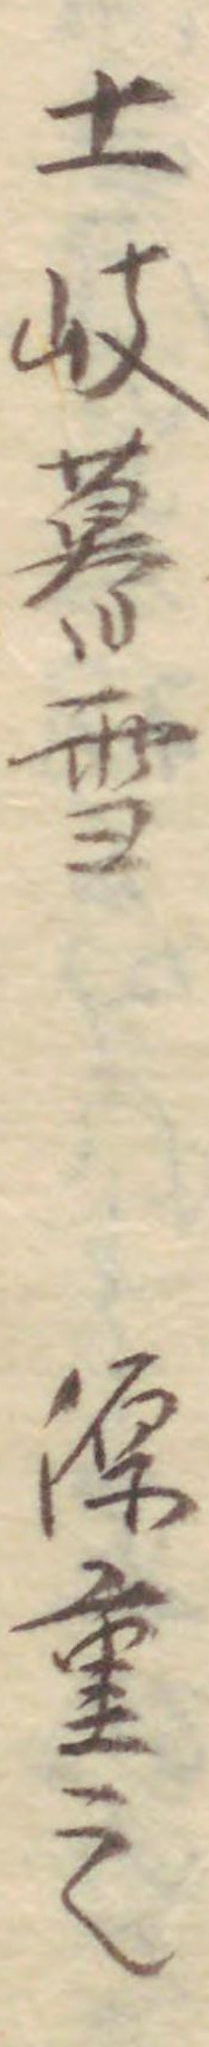土岐暮雪源重之
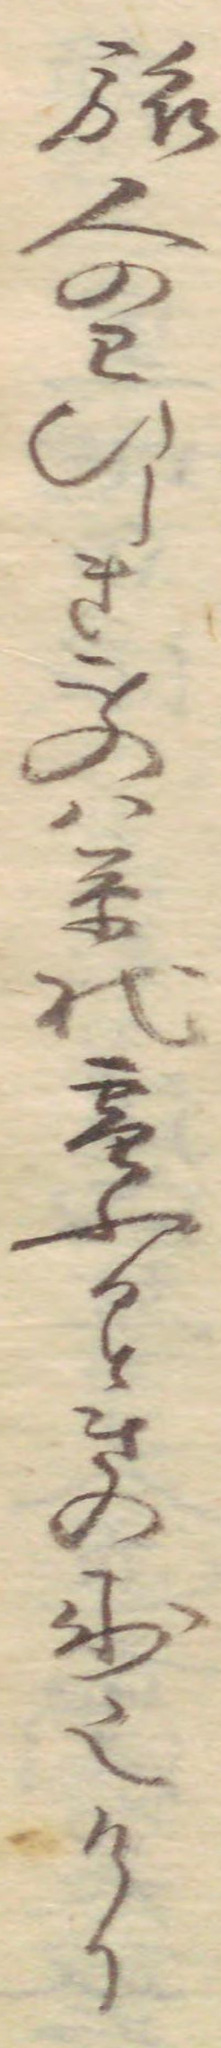旅人のわひしきものは草枕雪ふるときの氷也けり

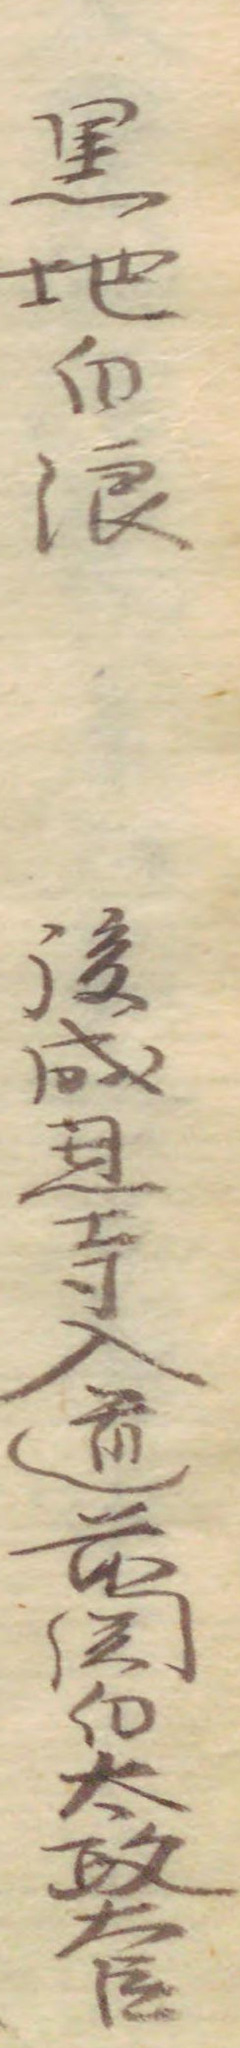黒地白浪後成恩寺入道前関白太政大臣
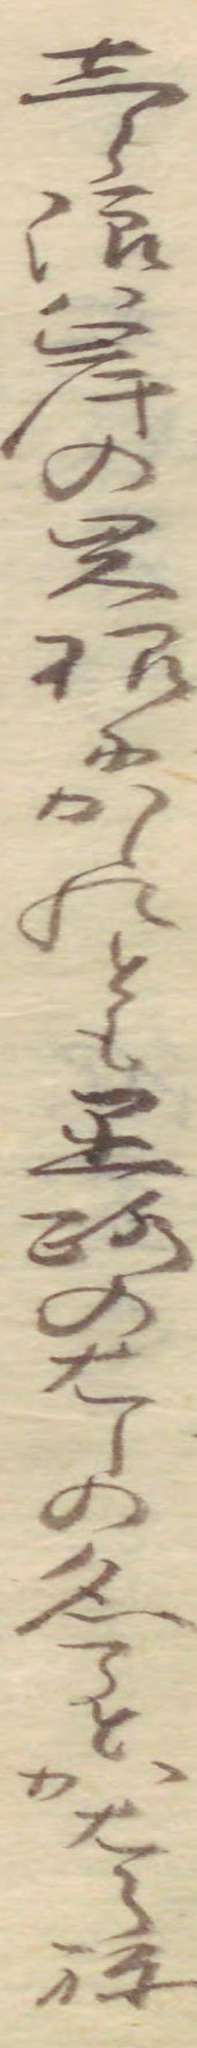しら浪は岸の岩根にかゝれとも黒路のはしの名こそかはらね
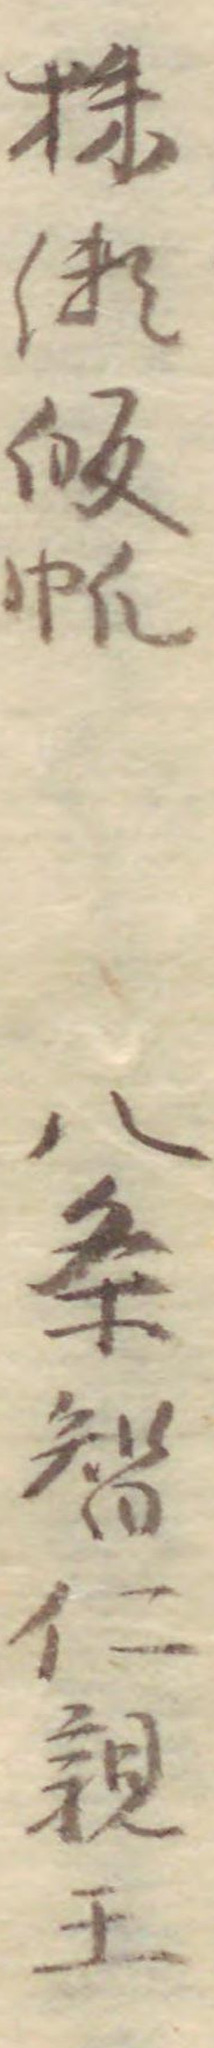株瀬皈帆八条智仁親王
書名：鶯宿雑記. 巻263-264
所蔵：国立国会図書館 National Diet Library, JAPAN
